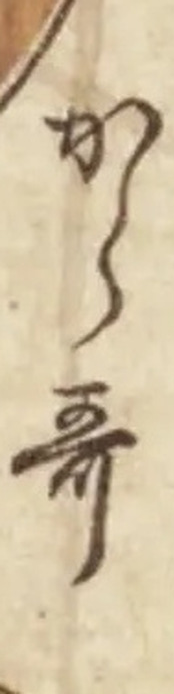から哥

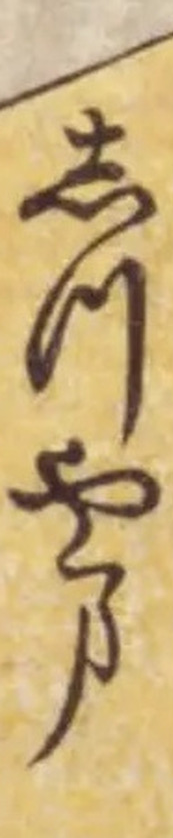しつやま

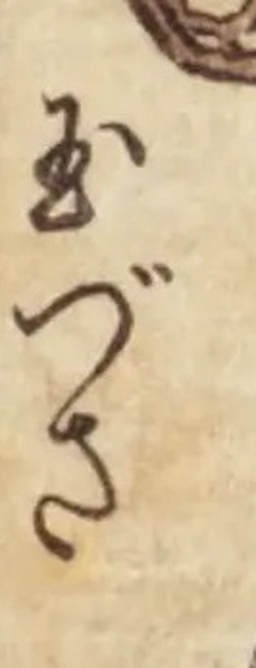玉づさ
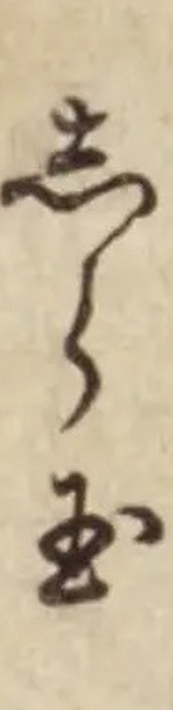しら玉

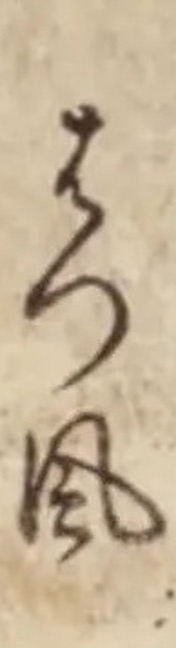はつ風
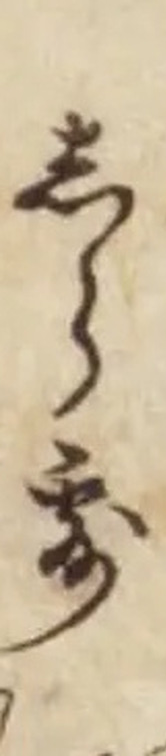しら露
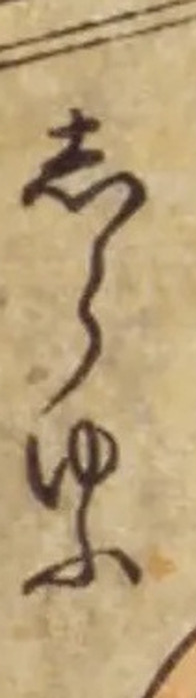しらゆふ

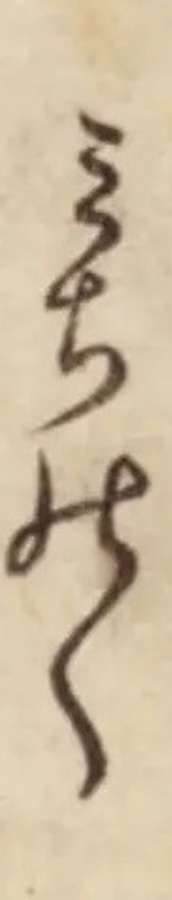みちのく
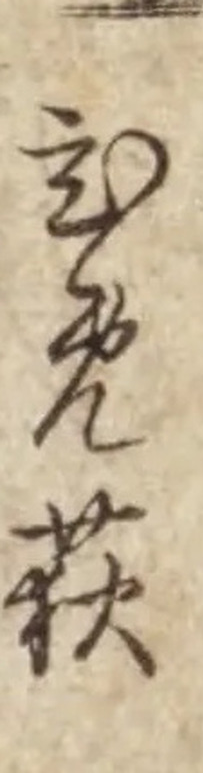ひめ荻

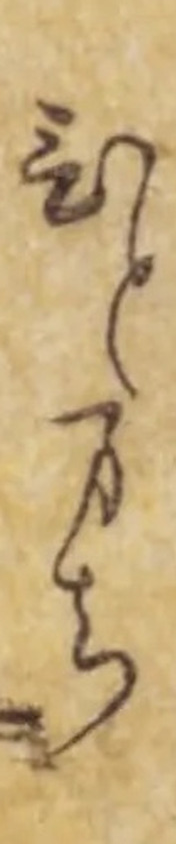ひとまち

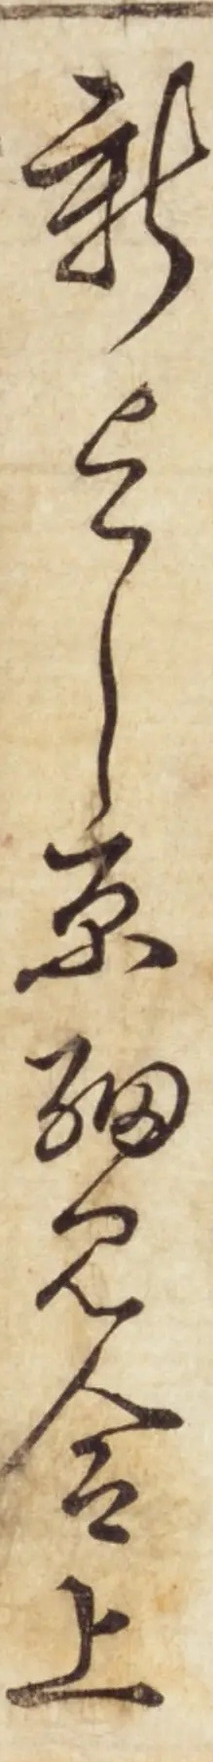新よし原細見合上
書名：青楼美人合姿鏡. 上
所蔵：国立国会図書館 National Diet Library, JAPAN
